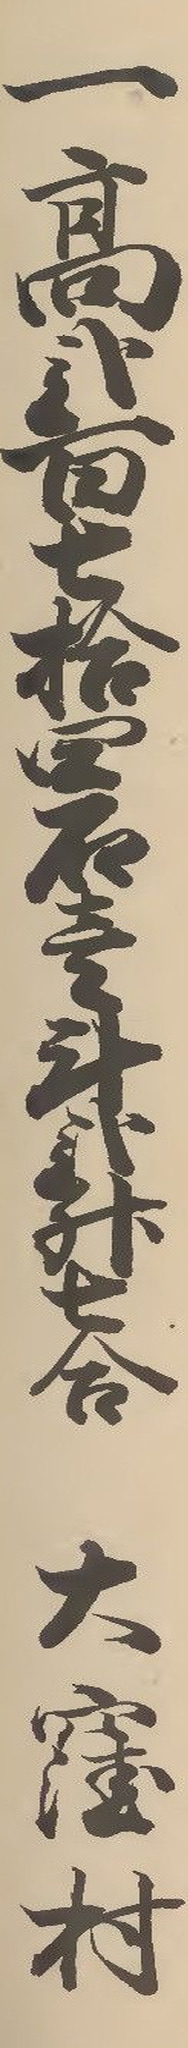一髙弐百七拾四石壱斗弐升七合大窪村
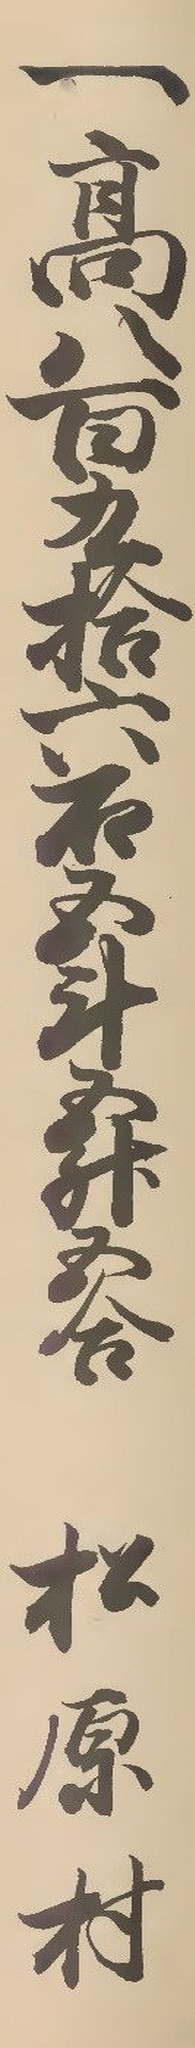一髙八百九拾六石五斗五升五合松原村
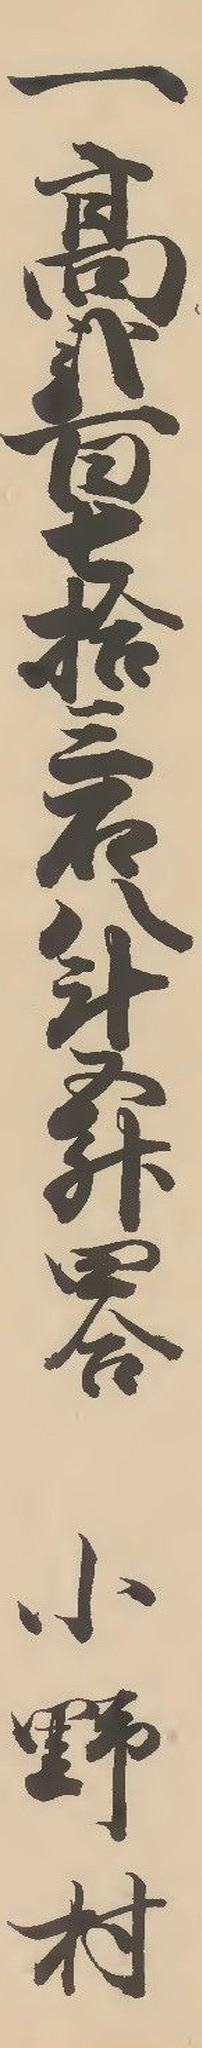一髙弐百七拾三石八斗五升四合小野村
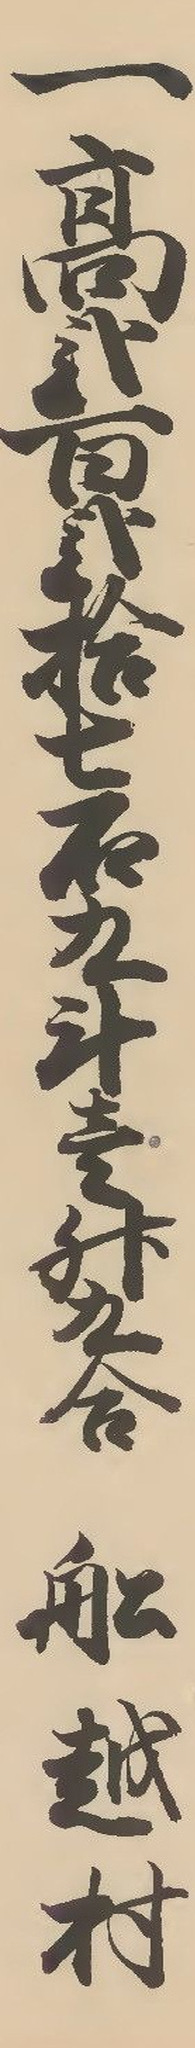一髙弐百弐拾七石九斗壱升九合船越村
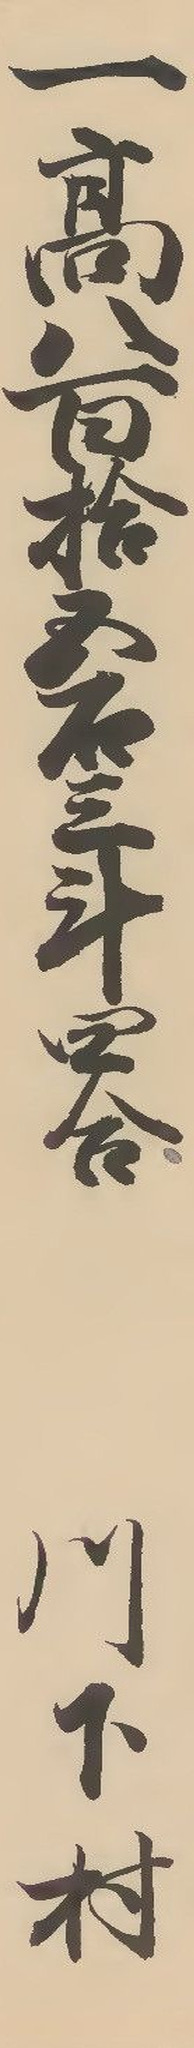一髙八百拾五石三斗四合川下村

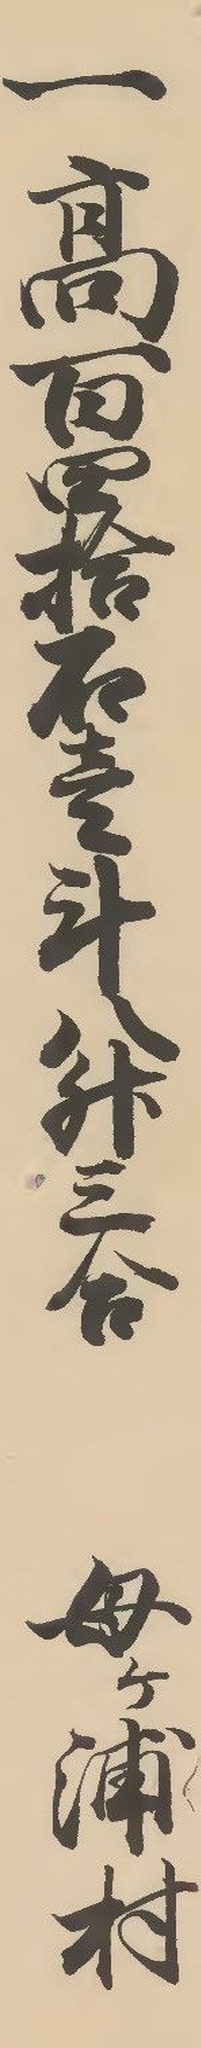一髙百四拾石壱斗八升三合母ケ浦村
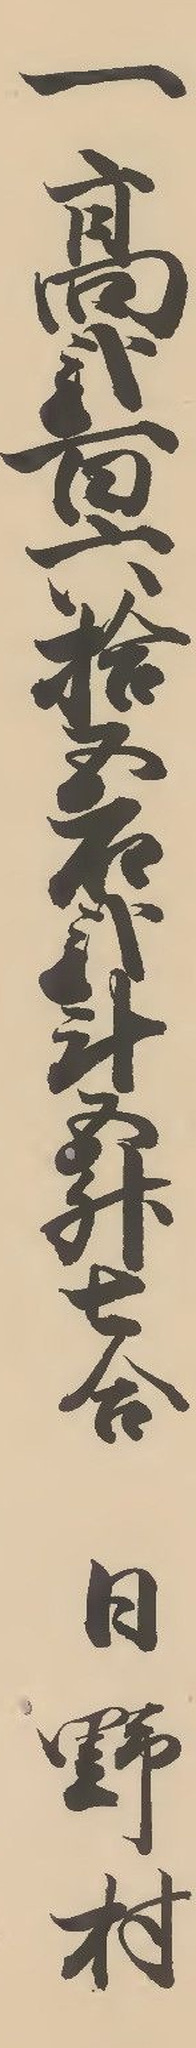一髙弐百六拾五石弐斗五升七合日野村
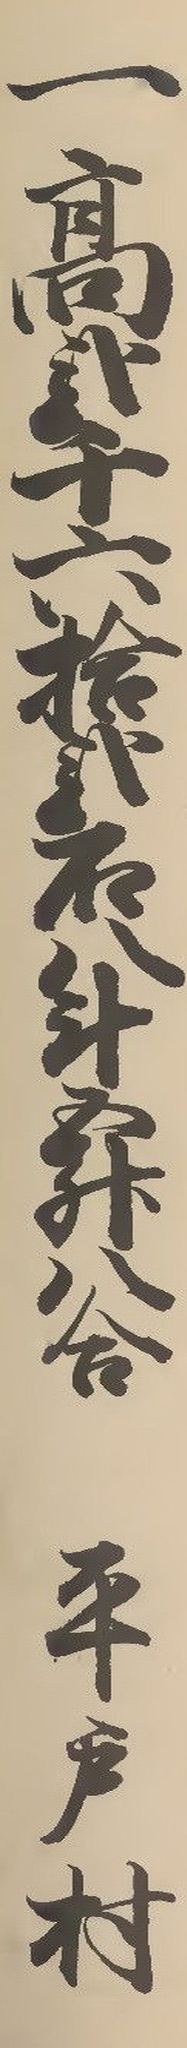一髙弐千六拾弐石八斗五升八合平戸村
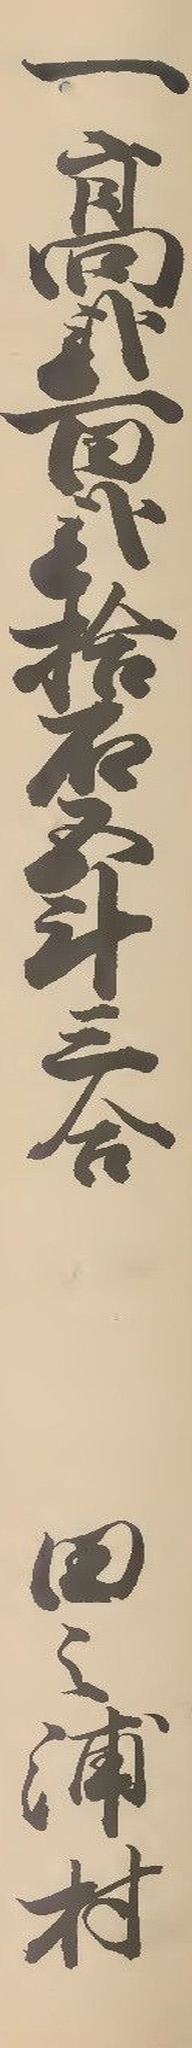一髙二百弐拾石五斗三合田之浦村
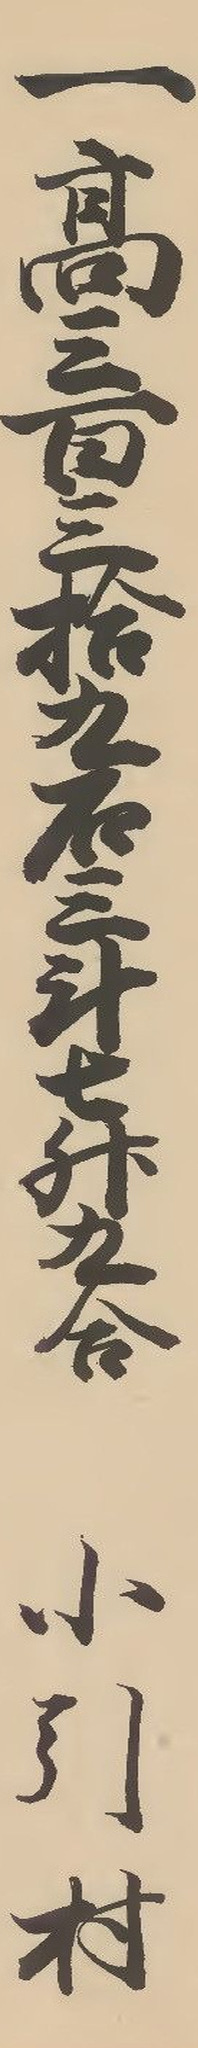一髙三百三拾九石三斗し七九合小引村
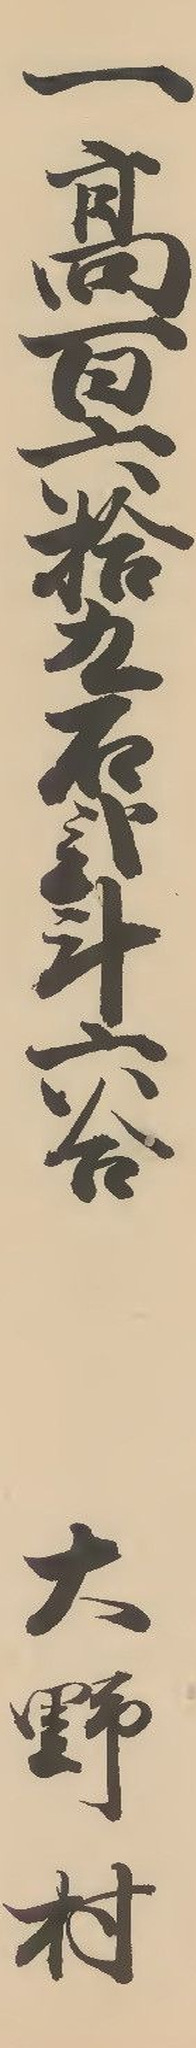一髙百六拾九石弐斗六合大野村
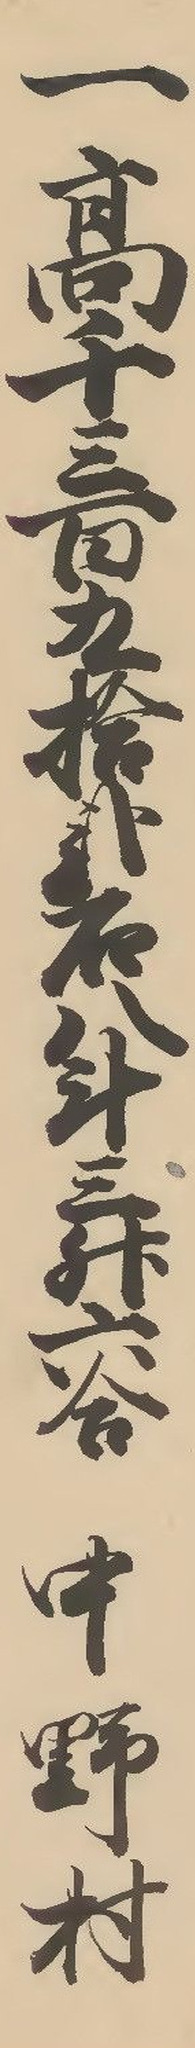一髙千三百九拾弐石八斗三升六合中野村

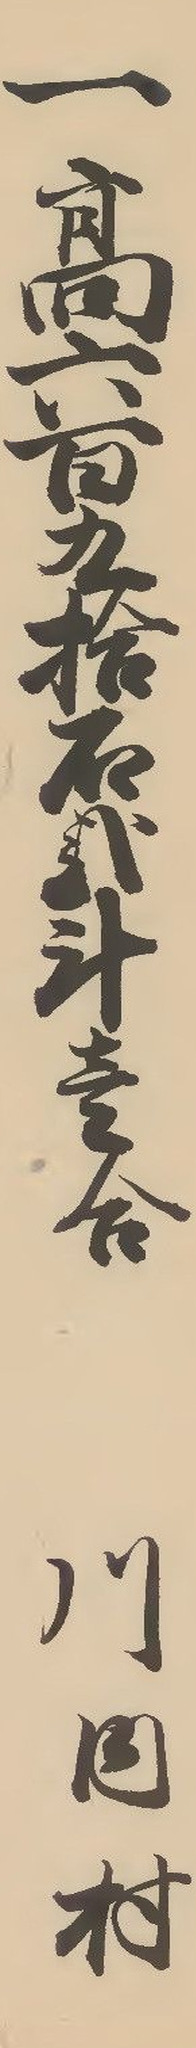一髙六百九拾石弐斗壱合川内村
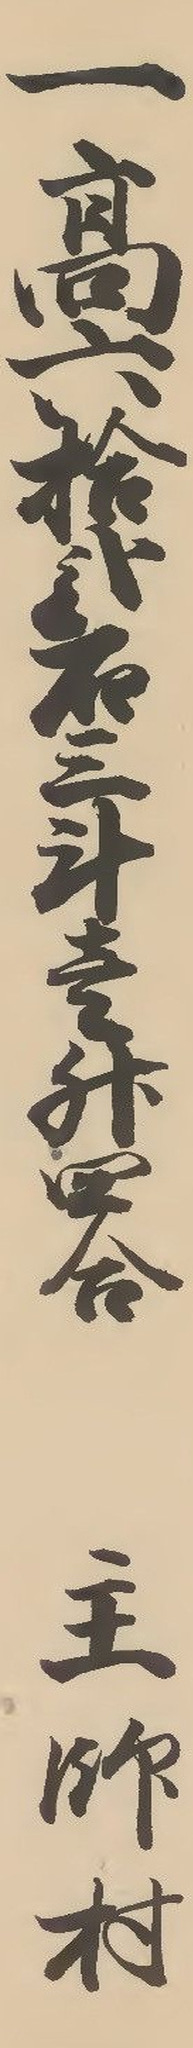一髙六拾弐石三斗壱升四合主師村
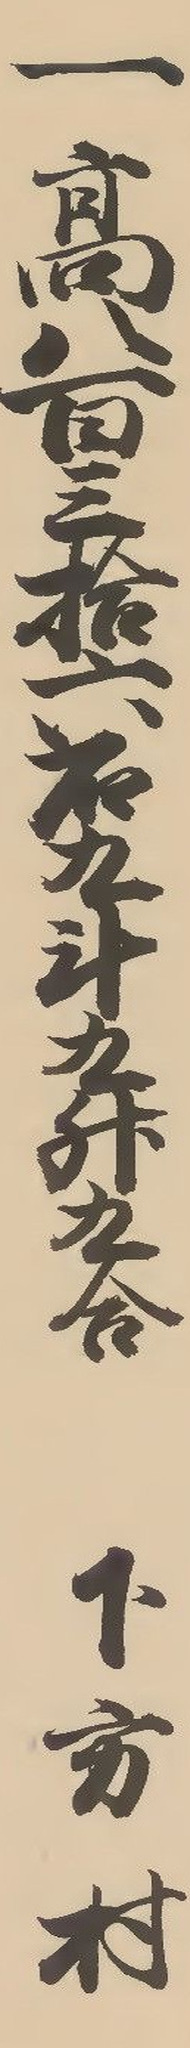一髙八百三拾六石九斗九升九合下方村
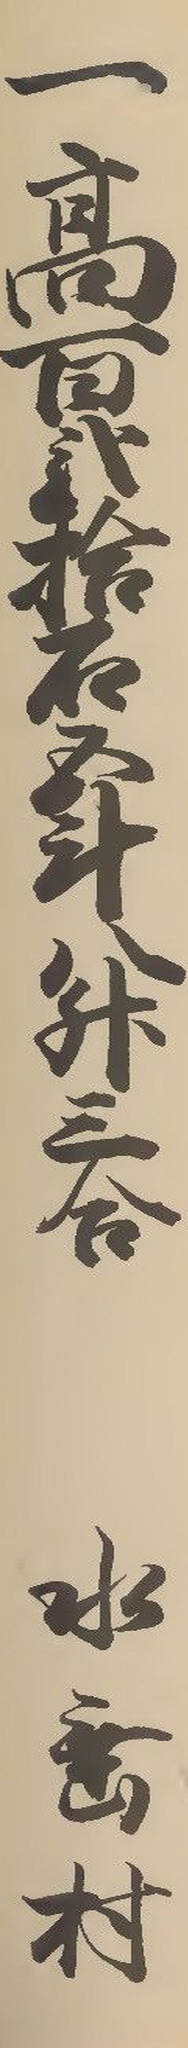一髙百弐拾石五斗八升三合水垂村
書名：肥前国郷帳
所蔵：国立公文書館 National Archives of Japan
